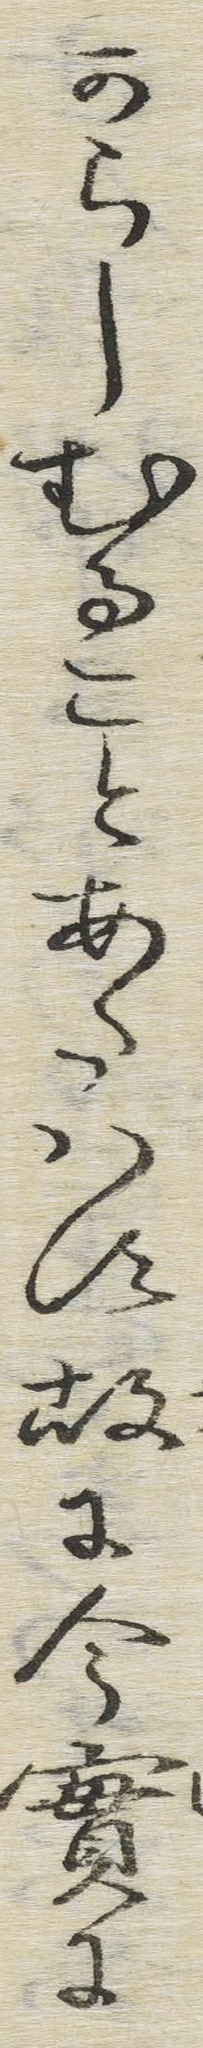からしむることあたはす故に今実に
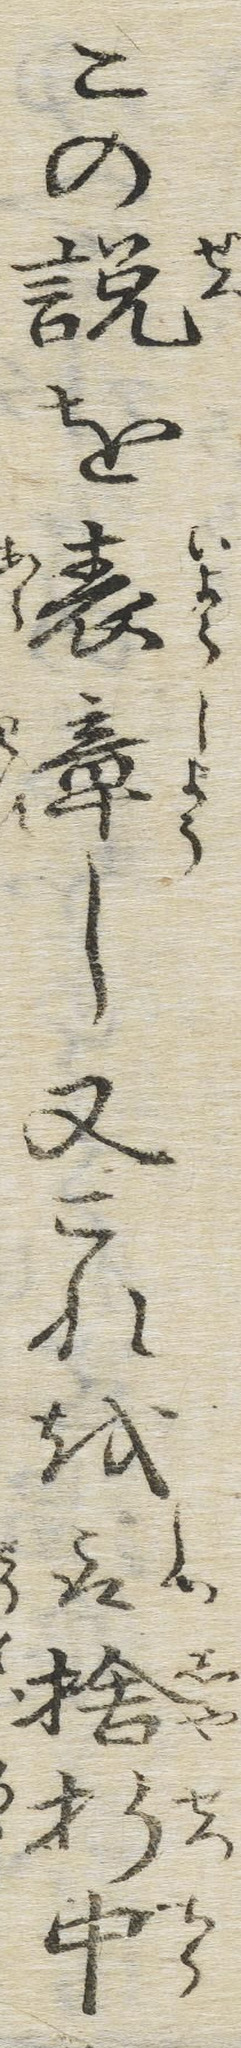この説を表章し又これを取捨折中
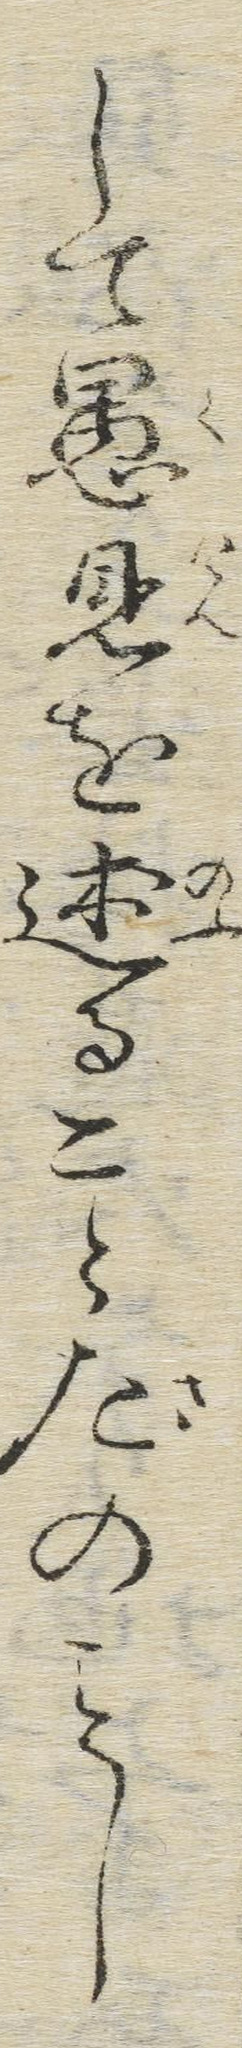して愚見を述ること左のことし
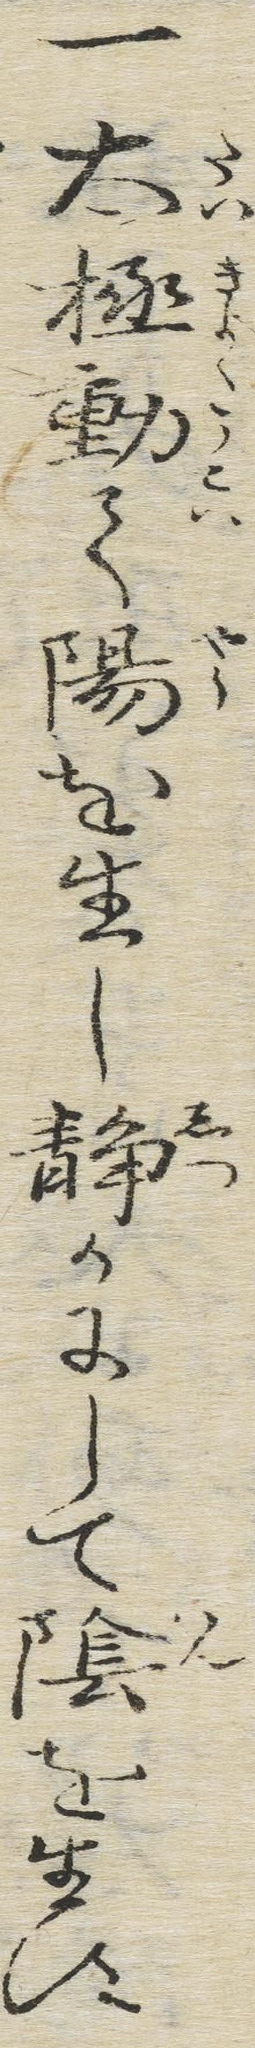一太極動て陽を生し静かにして陰を生す
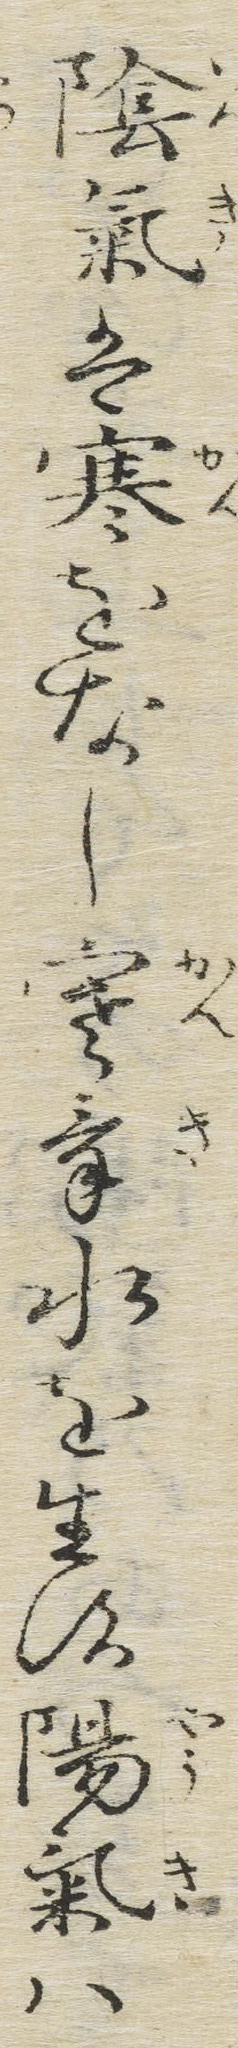陰気は寒をなし寒気水を生す陽気は
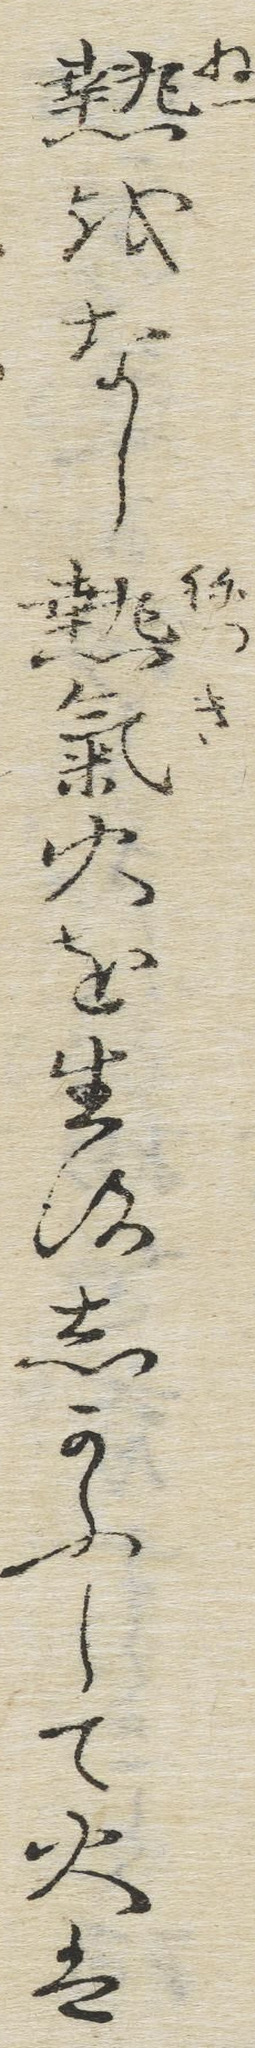熱をなし熱気火を生すしかふして火は
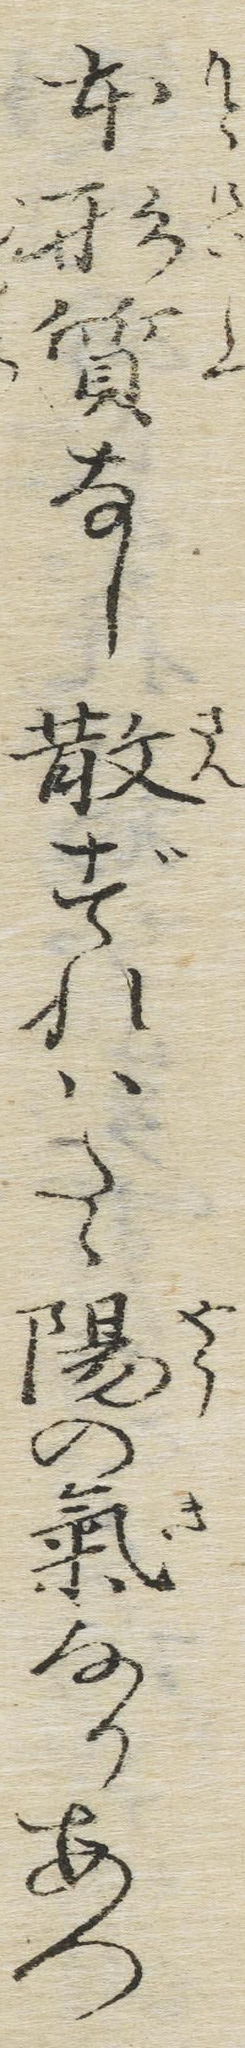本形質なし散ずれはたゝ陽の気なりあつ
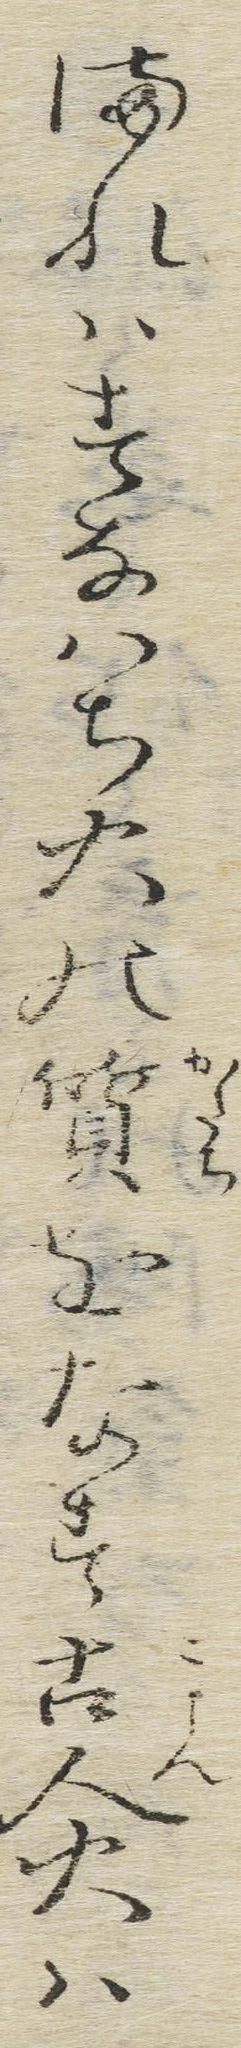まれはすなはち火の質をなす古人火は
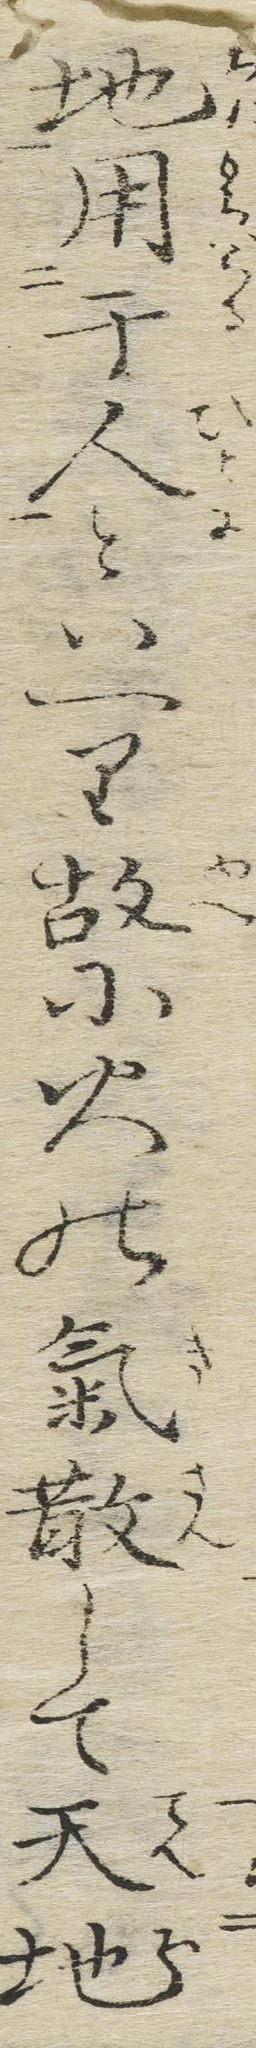地用于人といへり故に火の気散して天地

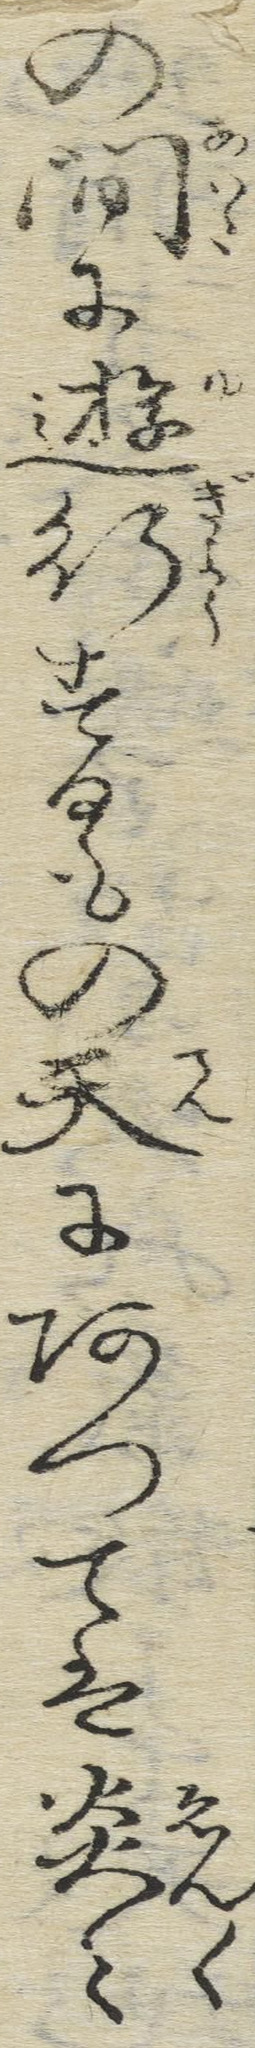の間に遊行するもの天にあつては炎々
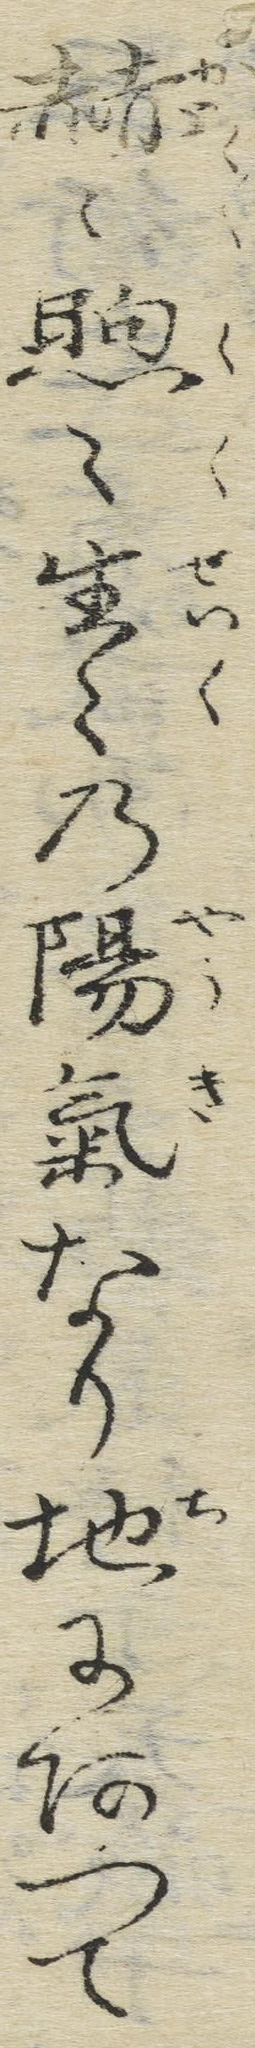赭々煦々生々の陽気なり地にあつて
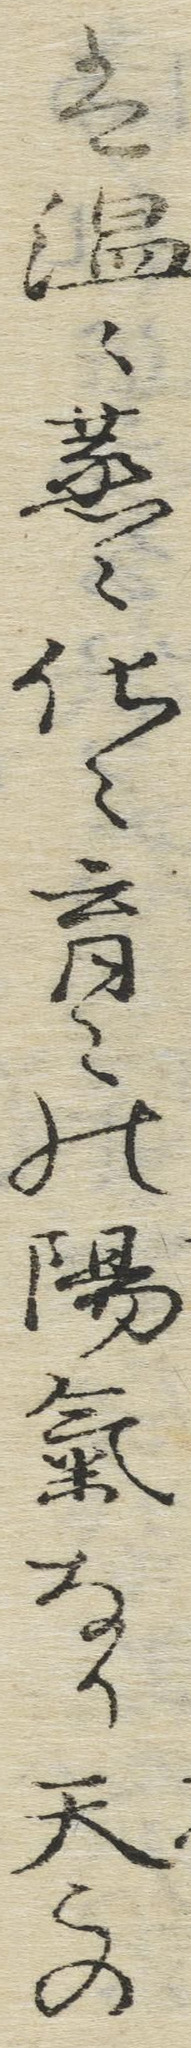は温々蒸々化々育々の陽気なり天この
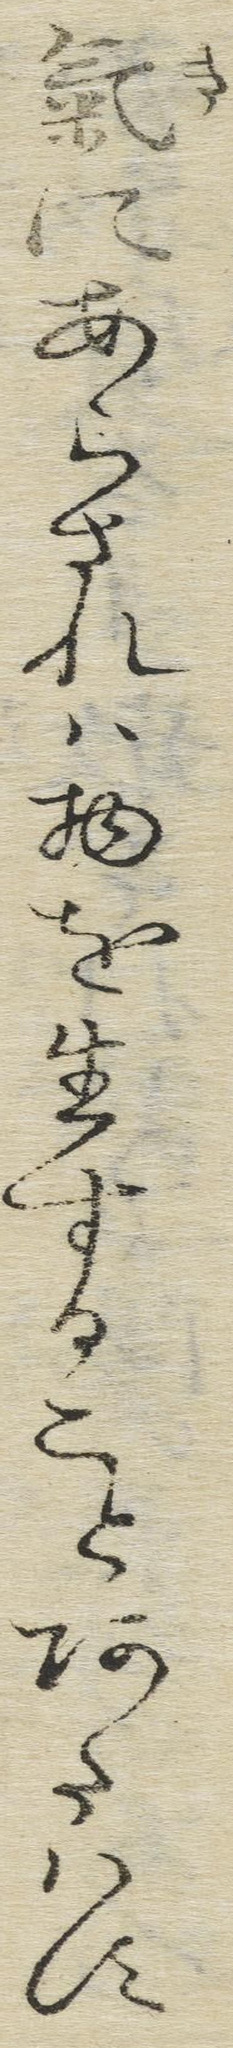気にあらされは物を生することあたはす
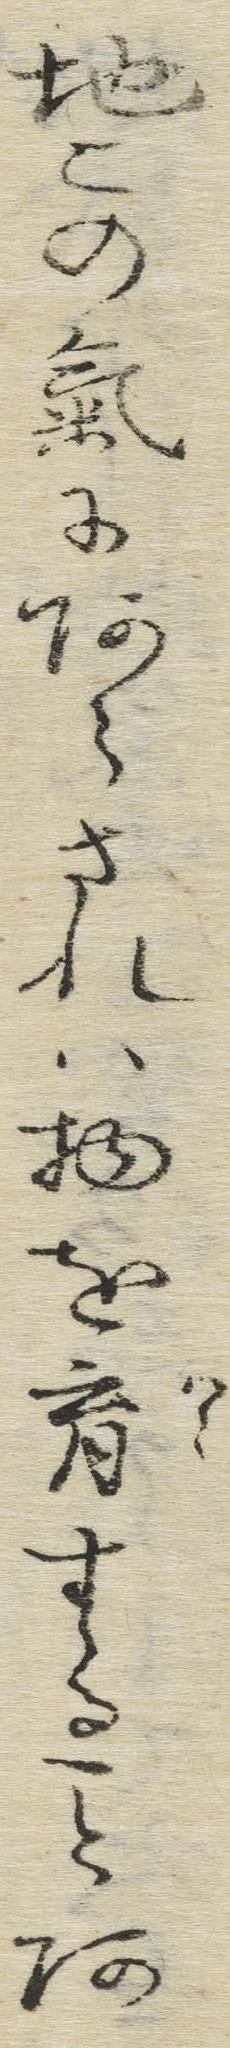地この気にあらされは物を育することあ
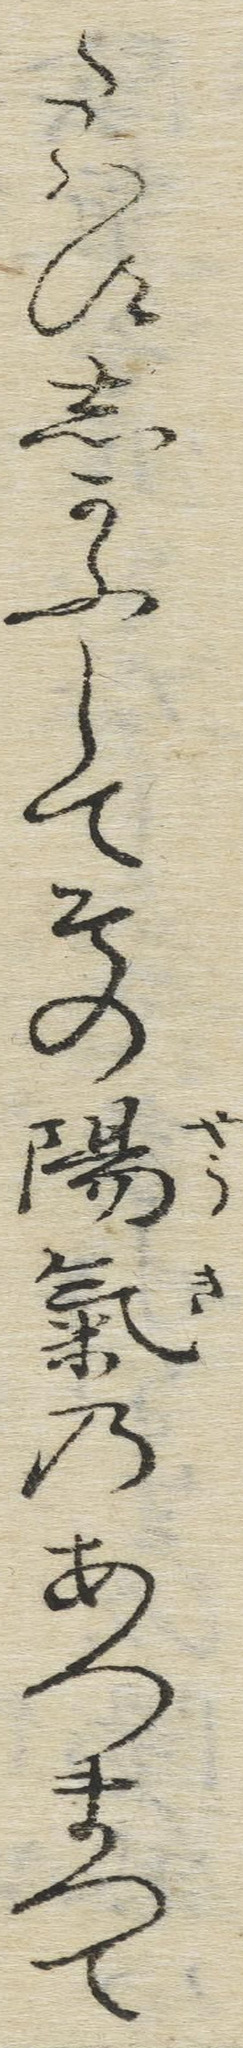たはすしかふしてその陽気のあつまつて
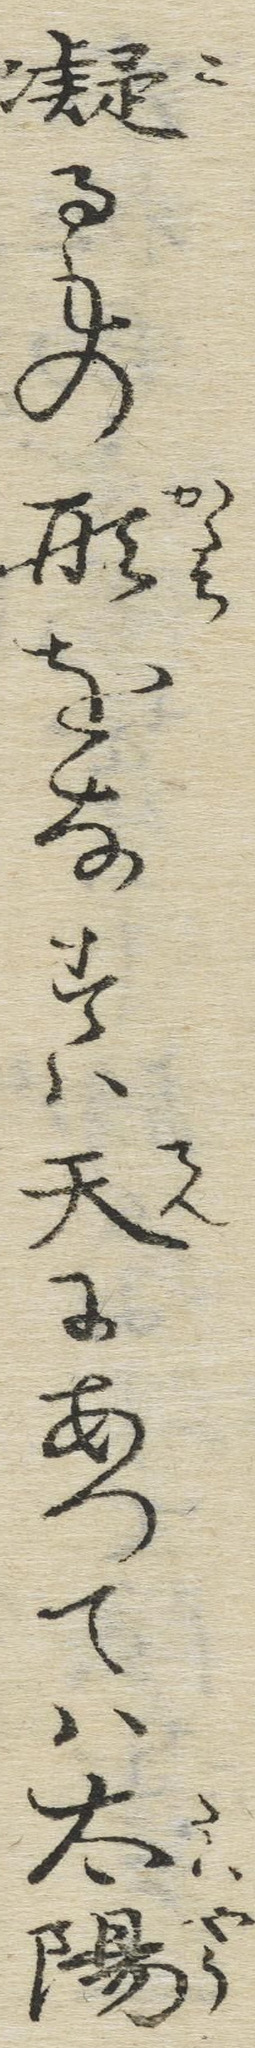凝るもの形をなすは天にあつては太陽
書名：温泉考
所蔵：東京大学地震研究所図書室 Earthquake Research Institute Library, The University of Tokyo, JAPAN
